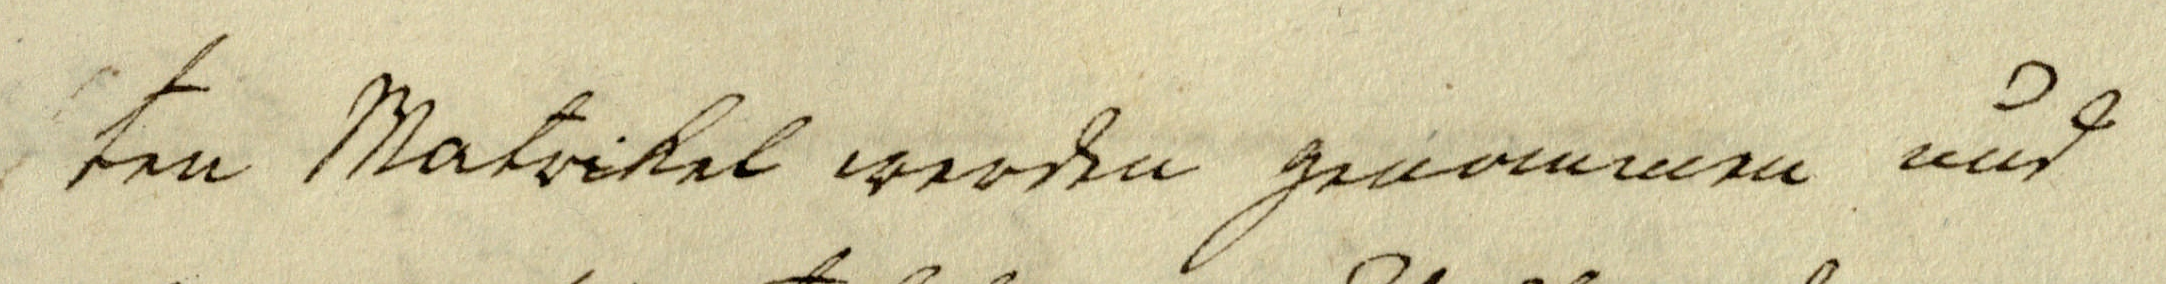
ten Matrikel werden genommen und
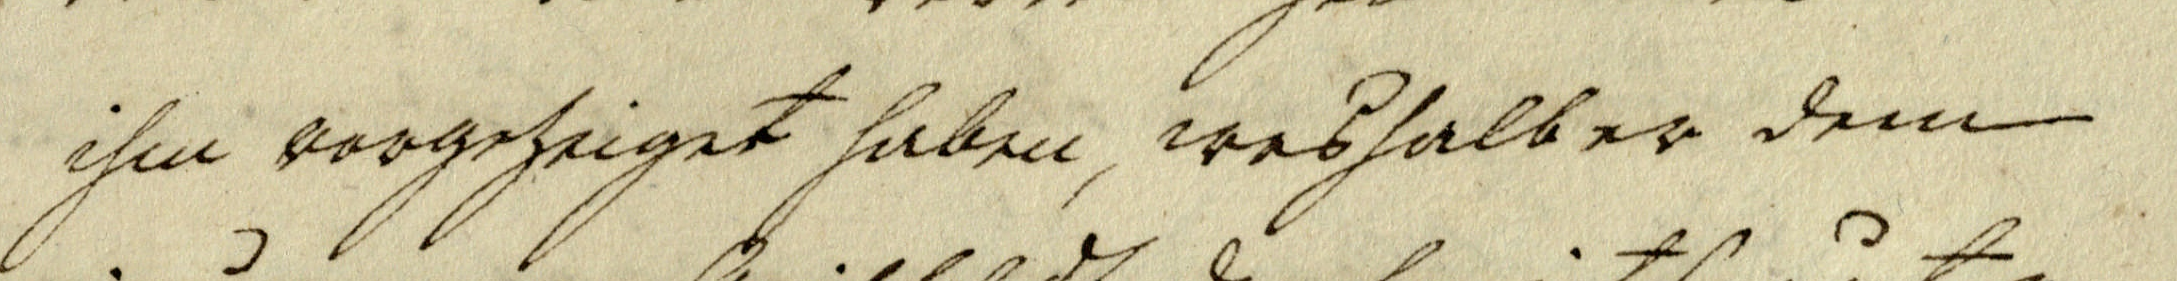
ihm vorgezeiget haben, weshalb er dem
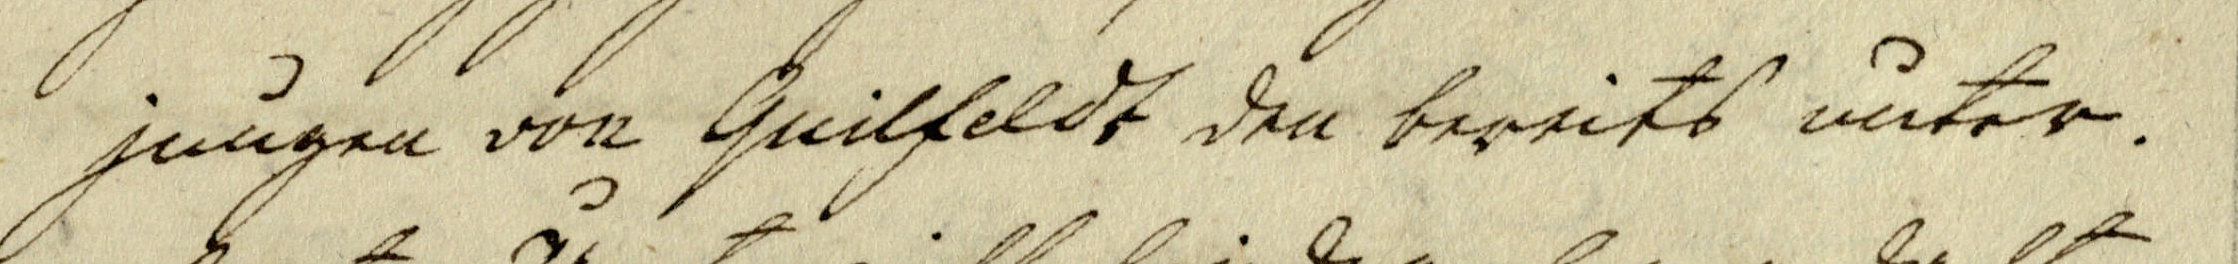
jungen von Quilfeldt den bereits unter¬
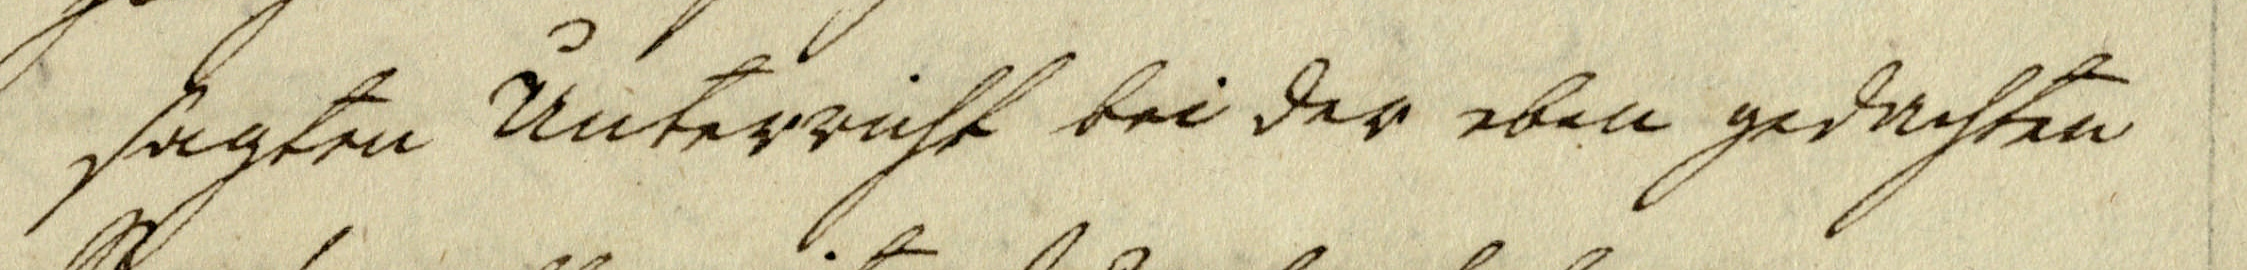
sagten Unterricht bei der eben gedachten
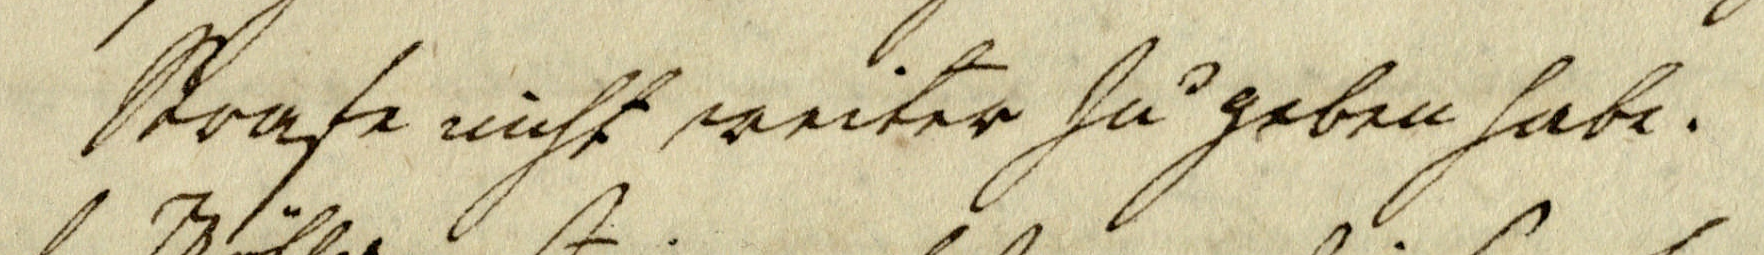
Strafe nicht weiter zu geben habe.
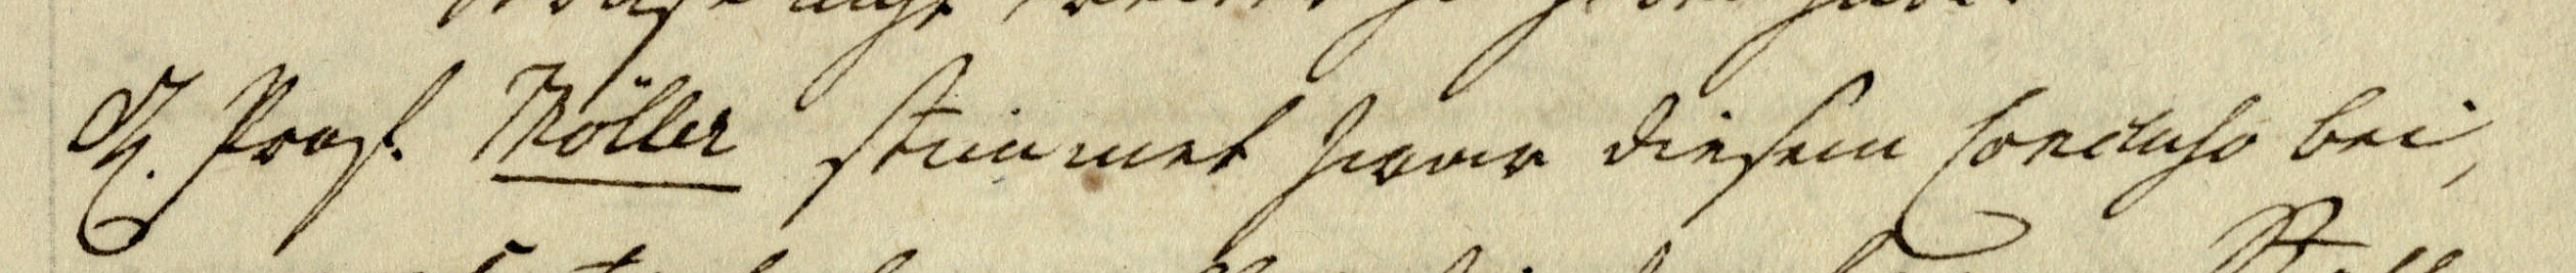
dh. Prof. Möller stimmet zwar diesem Concluso bei,
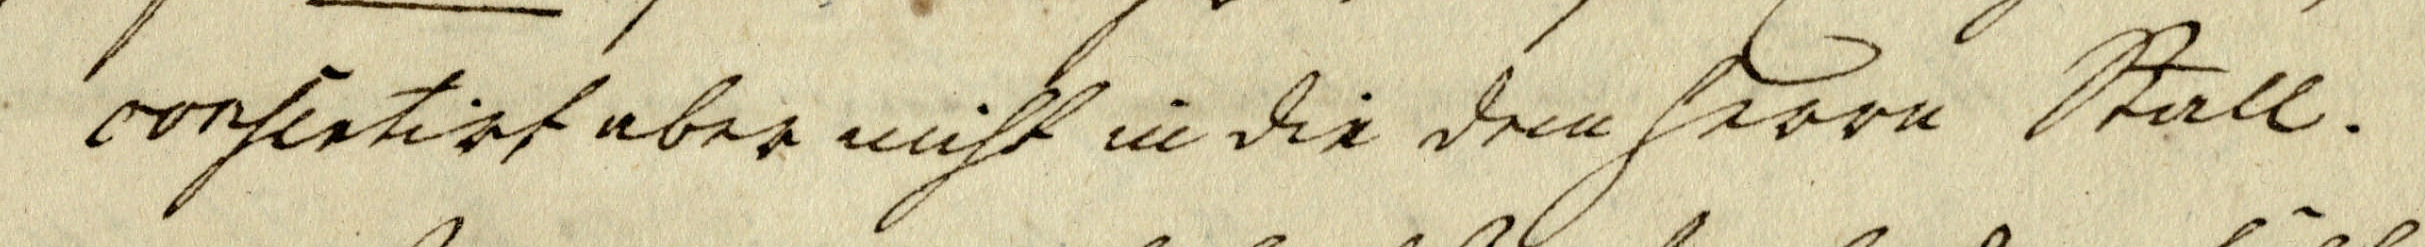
consentirt aber nicht in die dem Herrn Stall¬
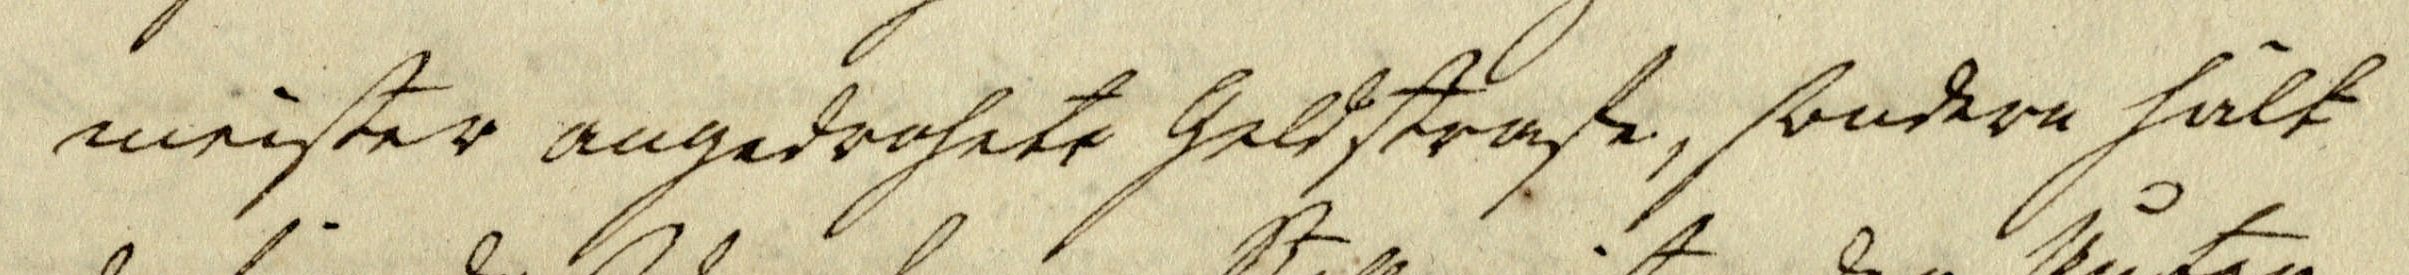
meister angedrohete Geldstrafe, sondern hält
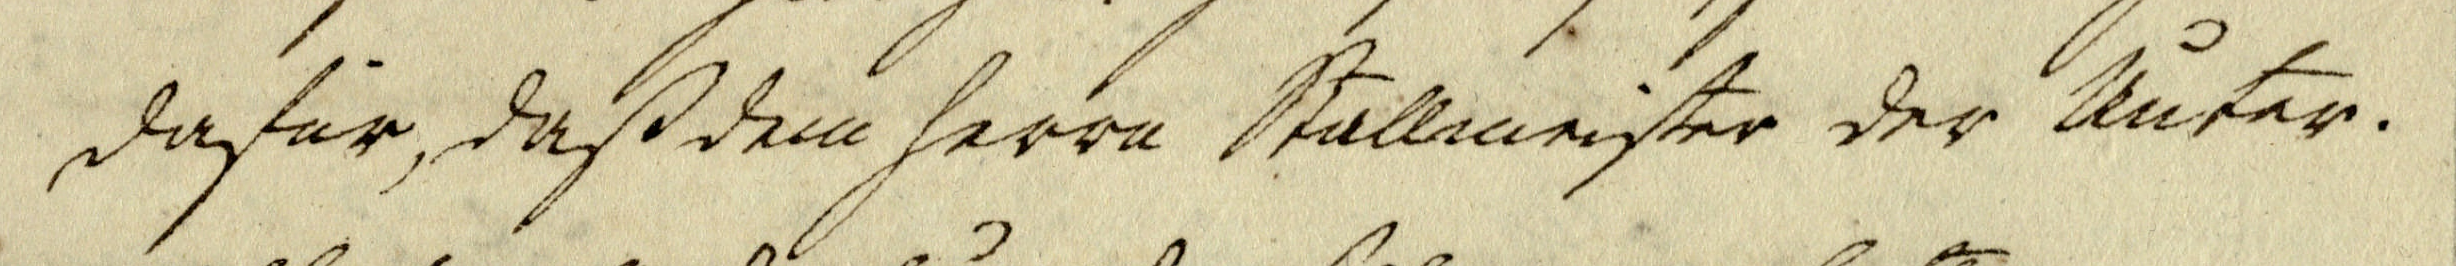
dafür, daß dem Herrn Stallmeister der Unter¬
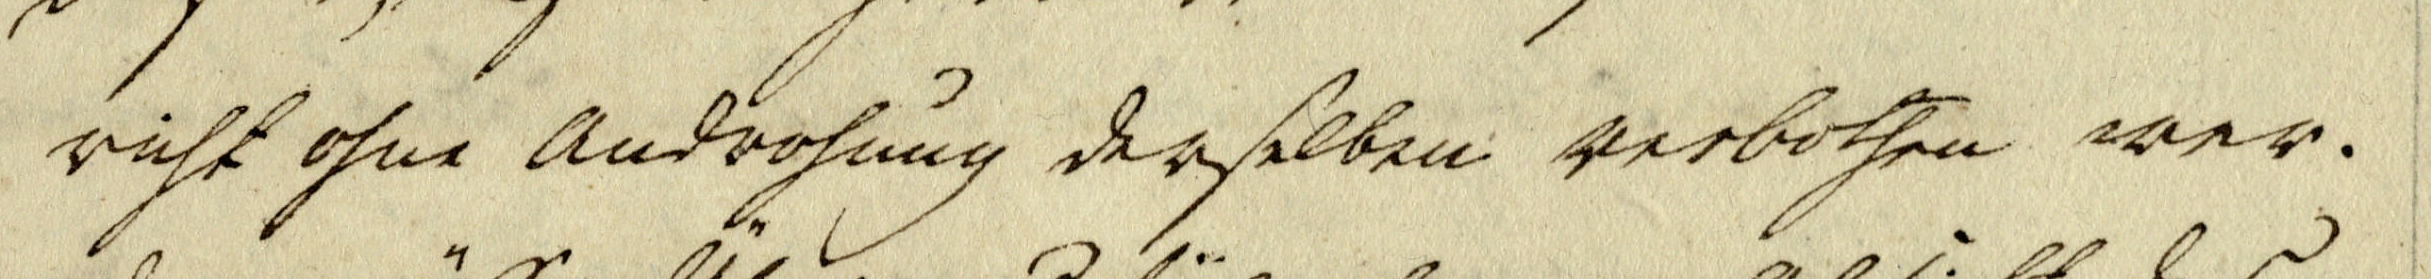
richt ohne Androhung derselben verbothen wer¬
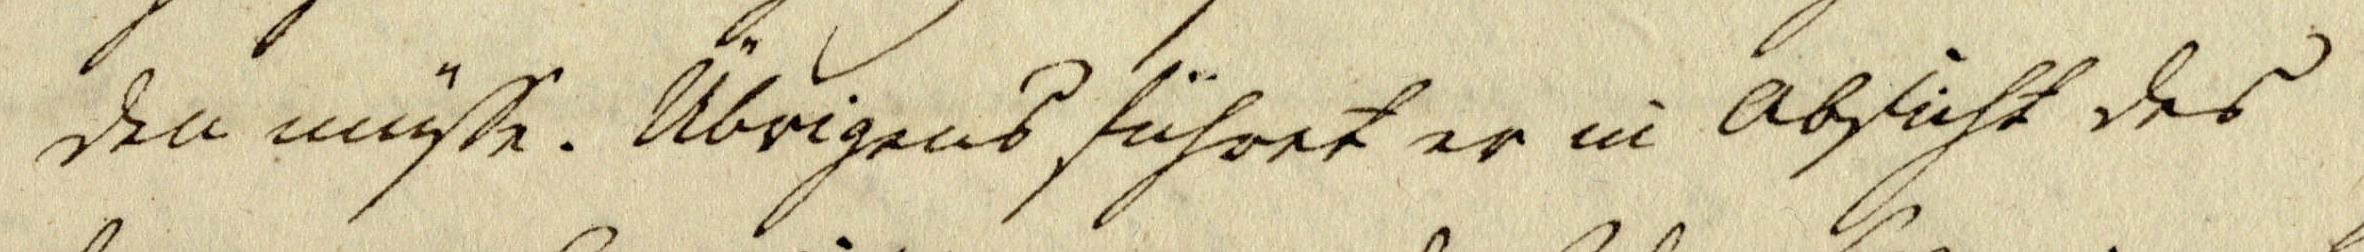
den müsse. Übrigens führet er in Absicht des
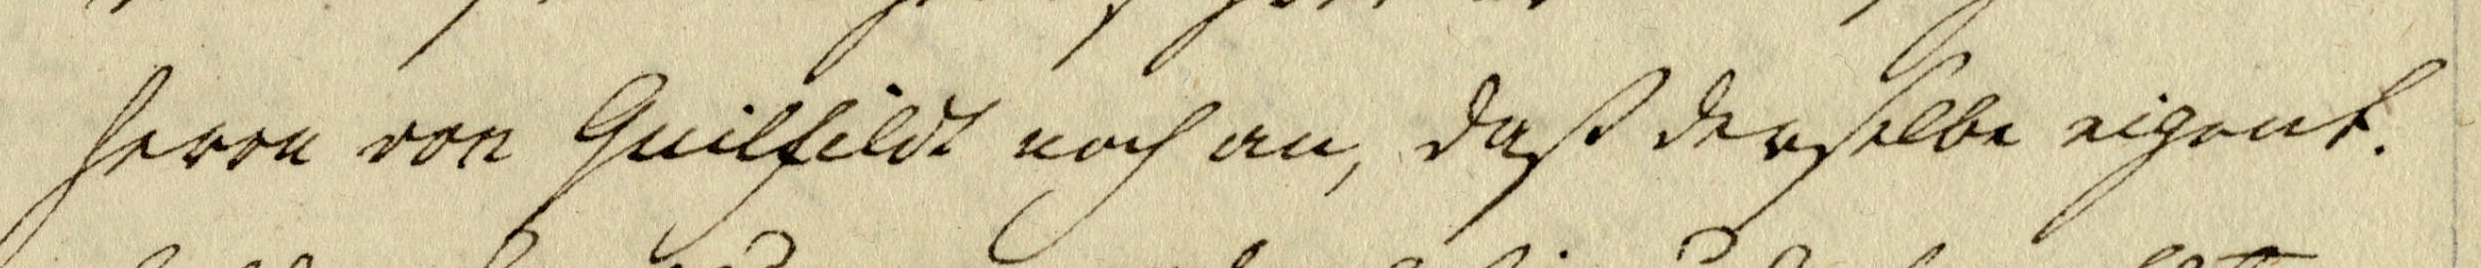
Herrn von Quilfeldt noch an, daß derselbe eigent¬
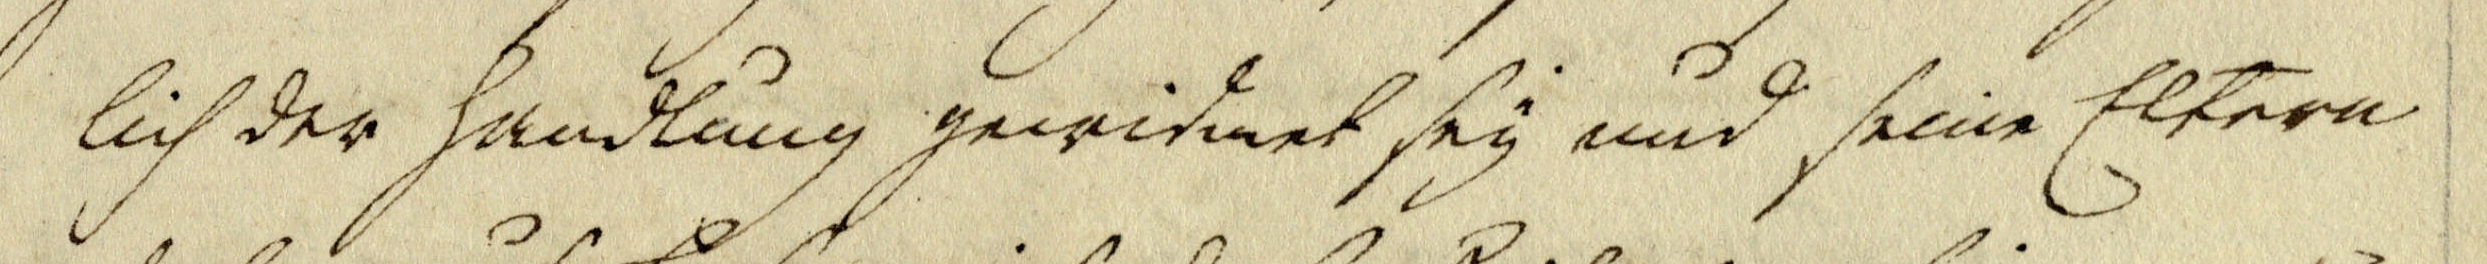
lich der Handlung gewidmet seÿ und seine Eltern
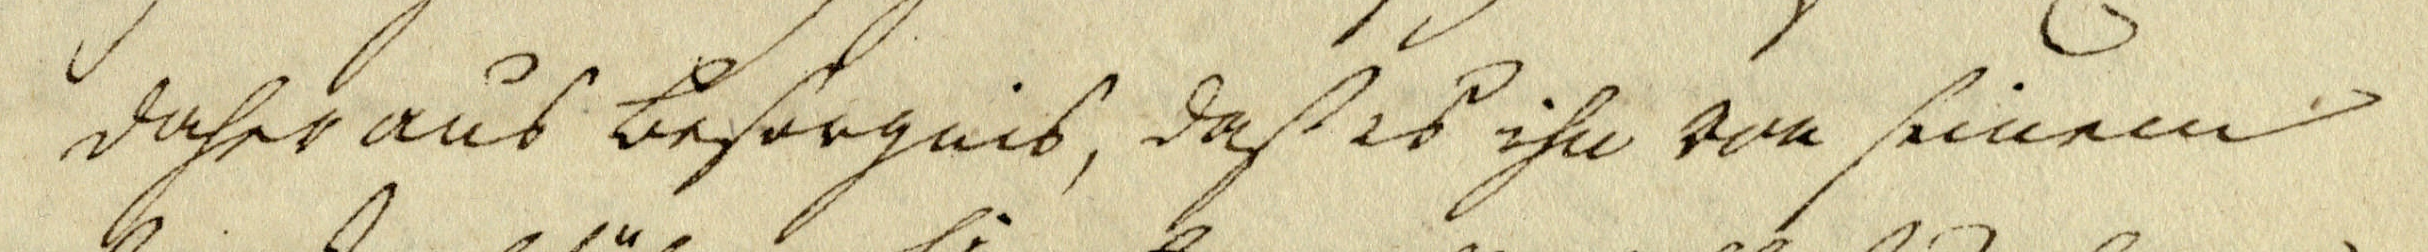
daher aus Besorgnis, daß es ihn von seinem
